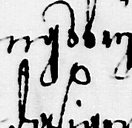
150.
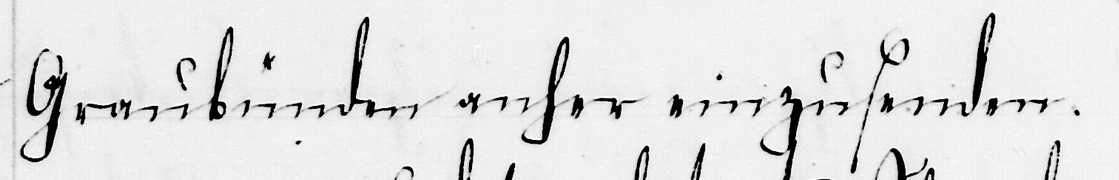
Graubünden anher einzusenden.
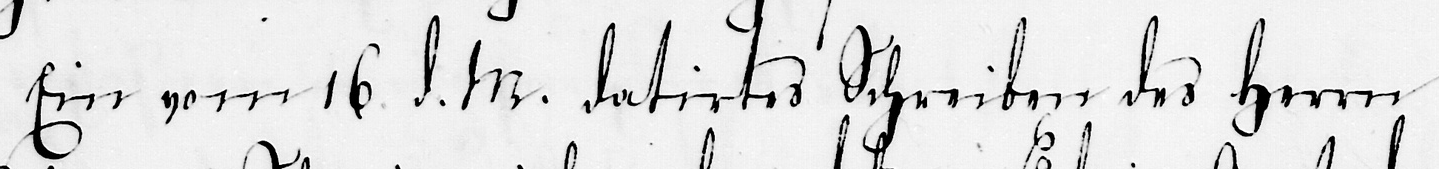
Ein vom 16. d. M. datirtes Schreiben des Herrn
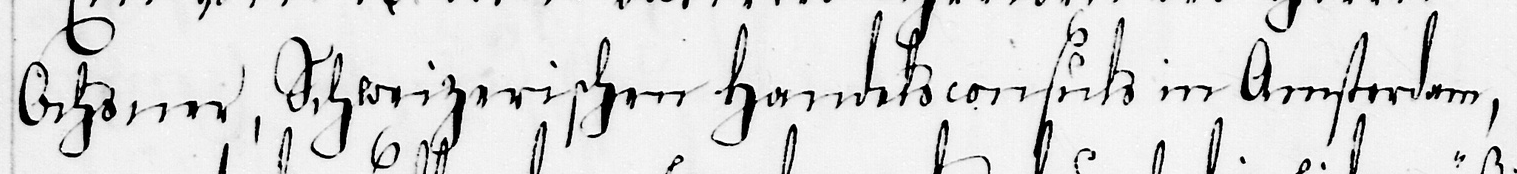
Ochsner, Schweizerischen Handelsconsuls in Amsterdam,
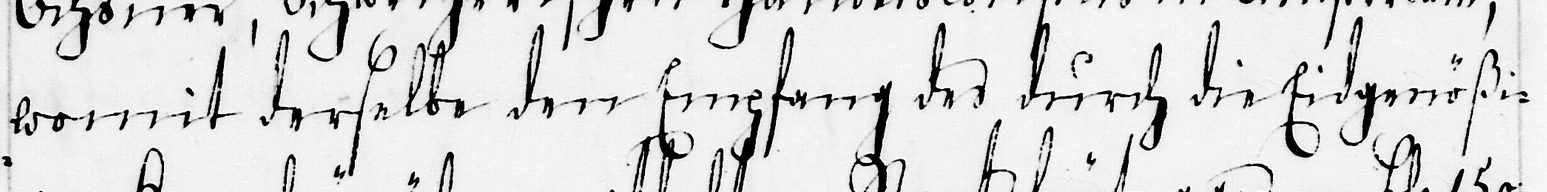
womit derselbe den Empfang des durch die Eidgenößis¬
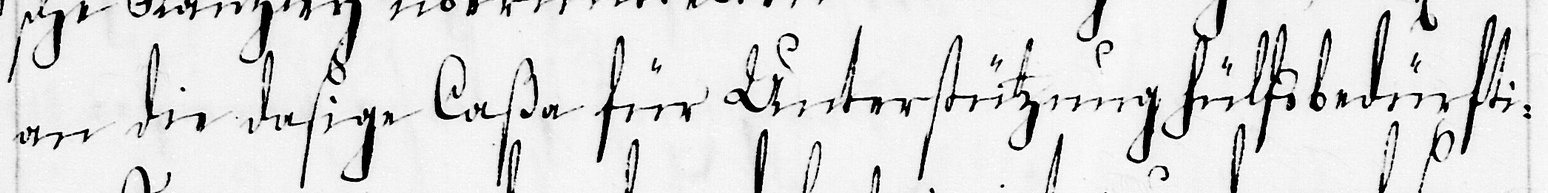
an die dasige Caßa für Unterstützung hülfsbedürfti¬
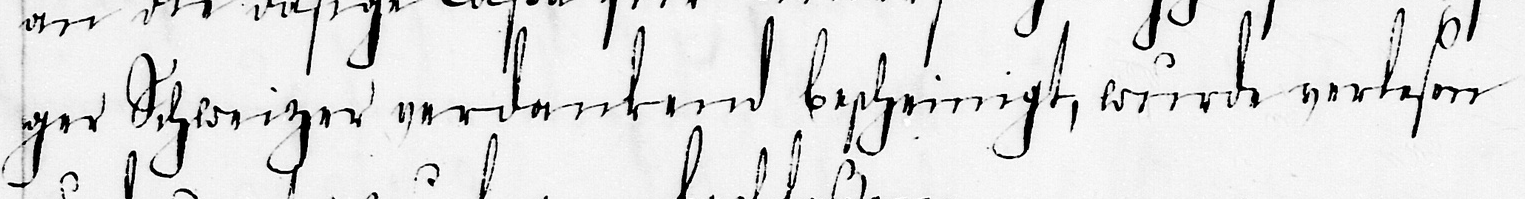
ger Schweizer verdankend bescheinigt, wurde verlesen
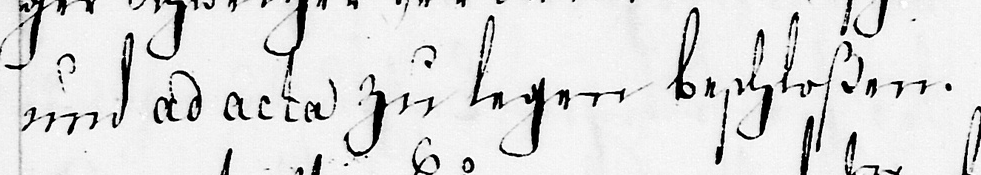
und ad acta zu legen beschloßen.
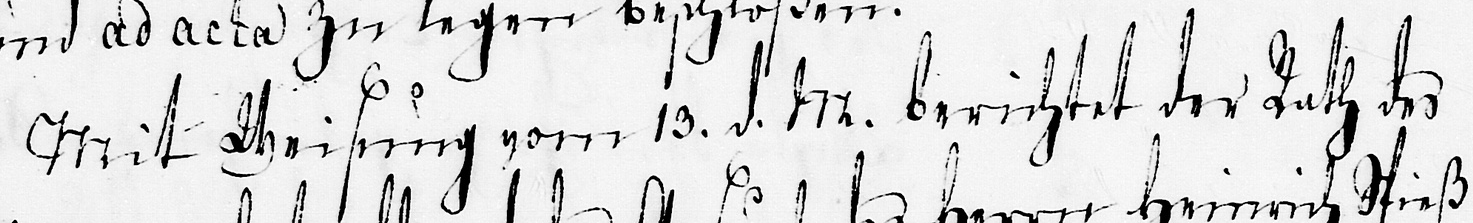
Mit Weisung vom 13. d. M. berichtet der Rath des
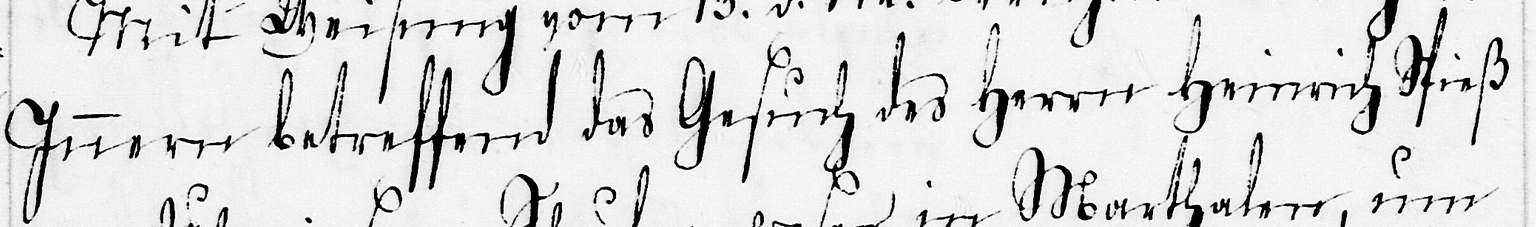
Innern betreffend das Gesuch des Herrn Heinrich Spieß
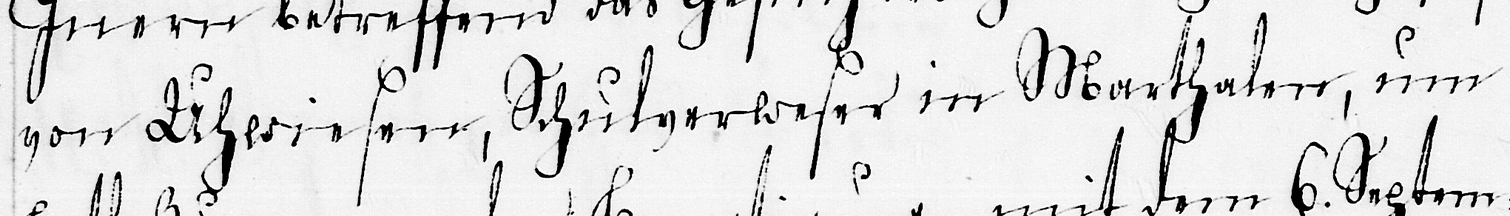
von Uhwiesen, Schulverweser in Marthalen, um
